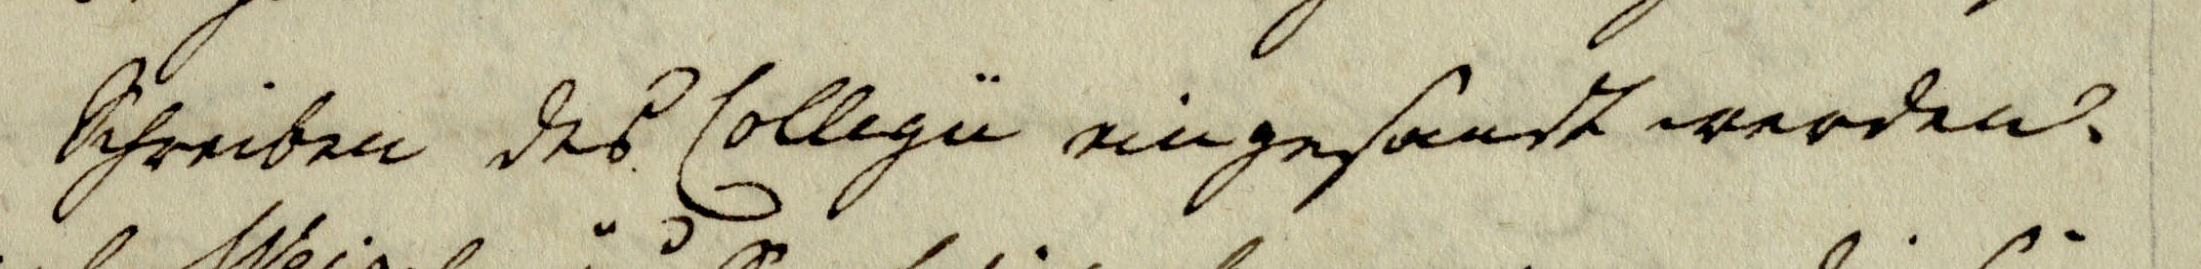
Schreiben des Collegii eingesandt werden.
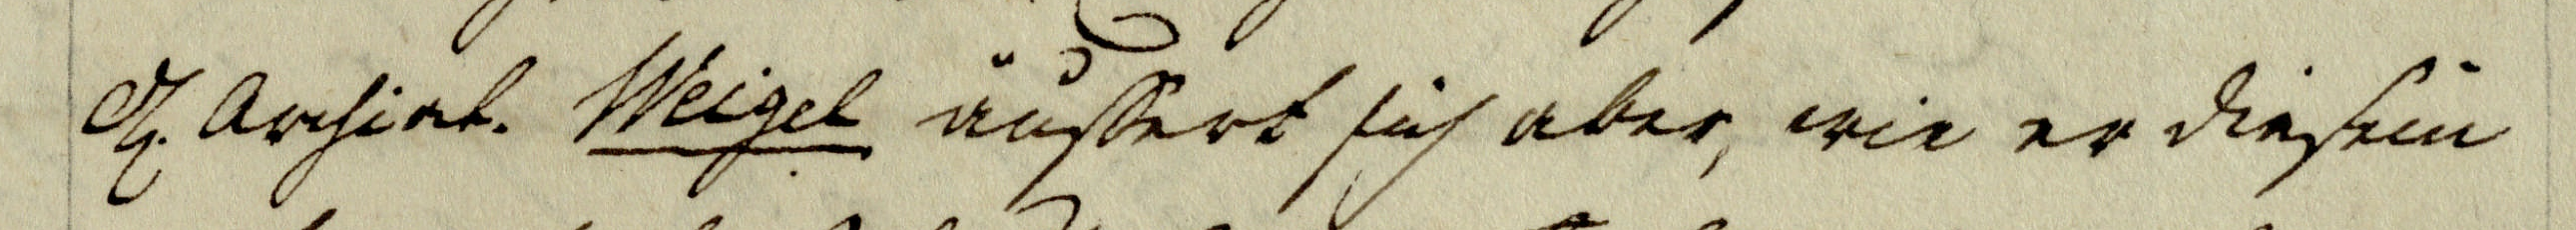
dh. Archiat. Weigel äussert sich aber, wie er diesem
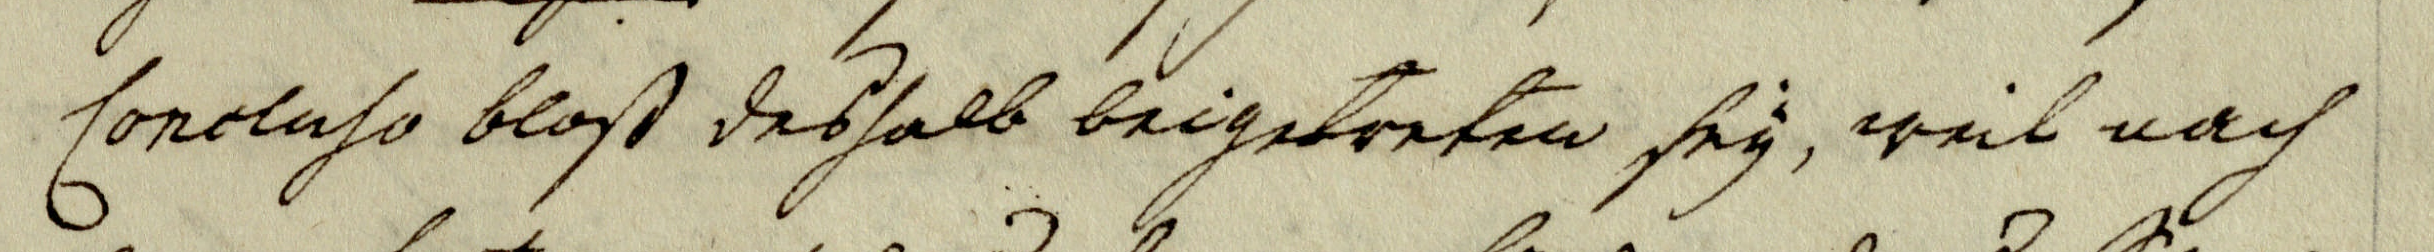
Concluso bloß deshalb beigetreten seÿ, weil nach
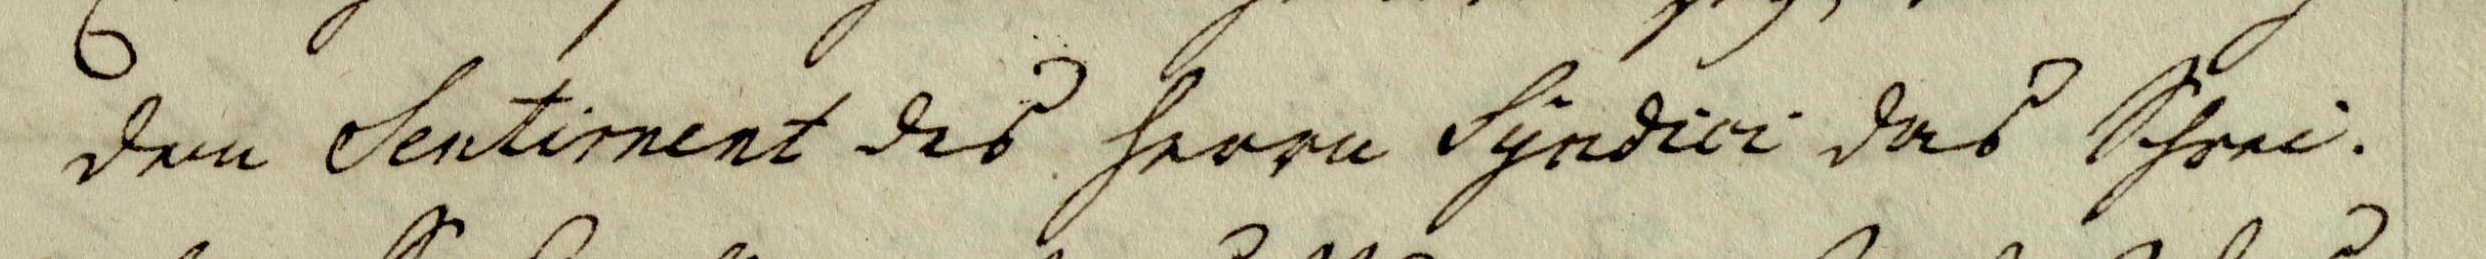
dem Sentiment des Herrn Sÿndici das Schrei¬
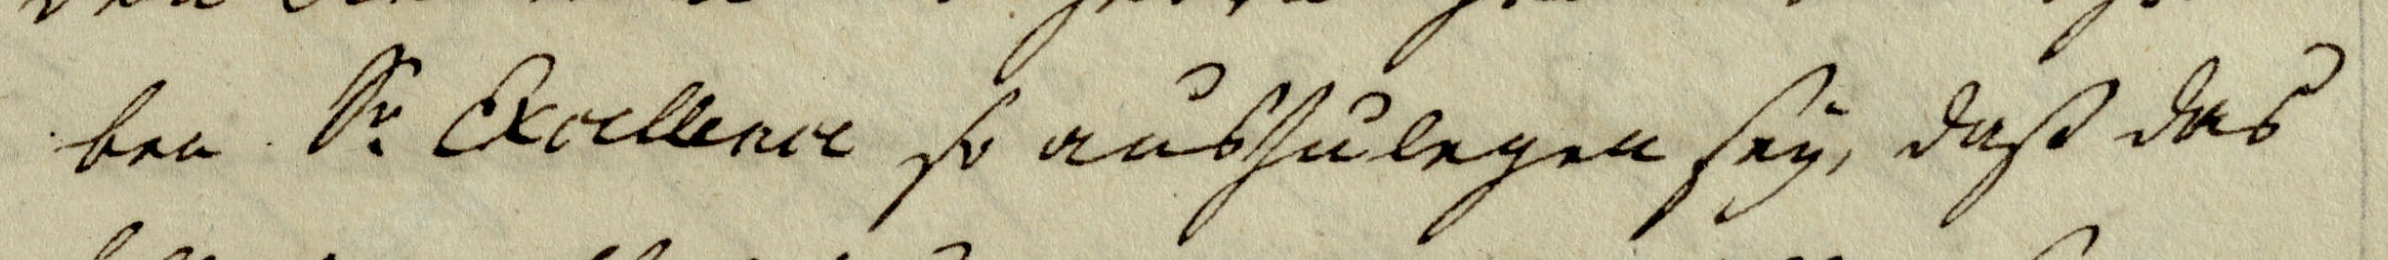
ben Sr Excellence so auszulegen seÿ, daß das
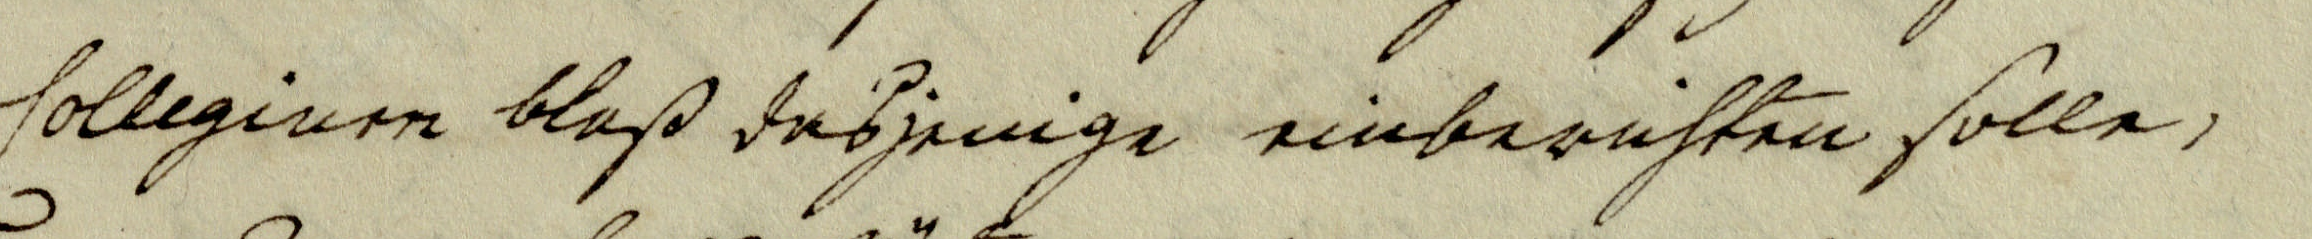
Collegium bloß dasjenige einberichten solle,
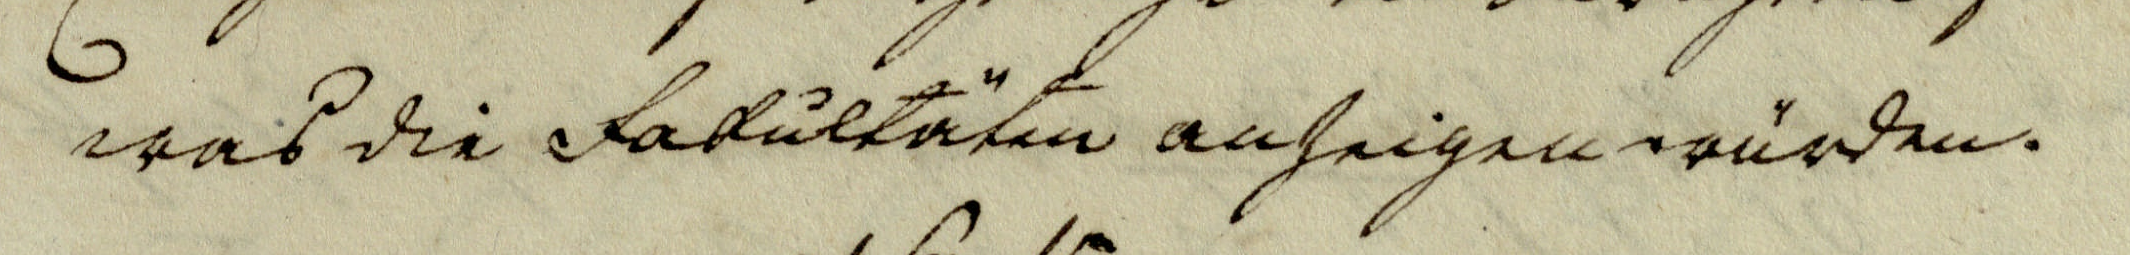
was die Fakultäten anzeigen würden.
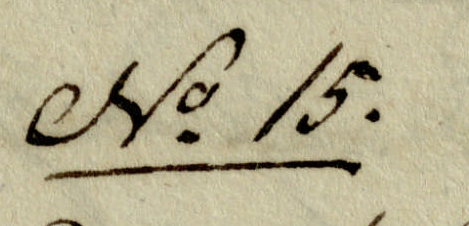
No 15.
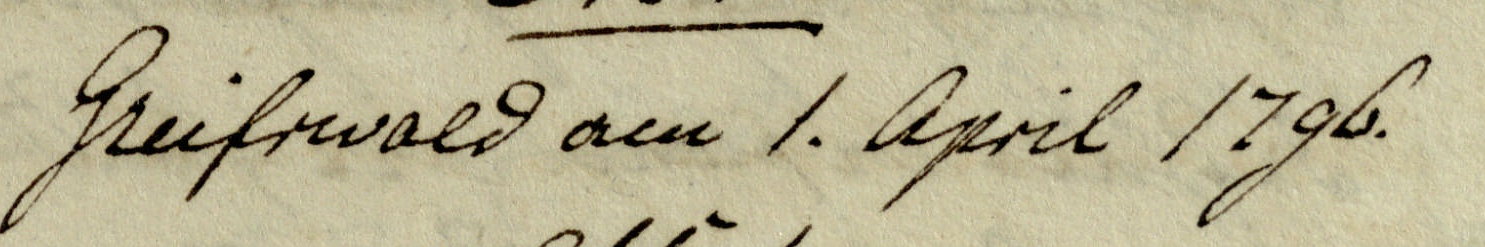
Greifswald am 1. April 1796.
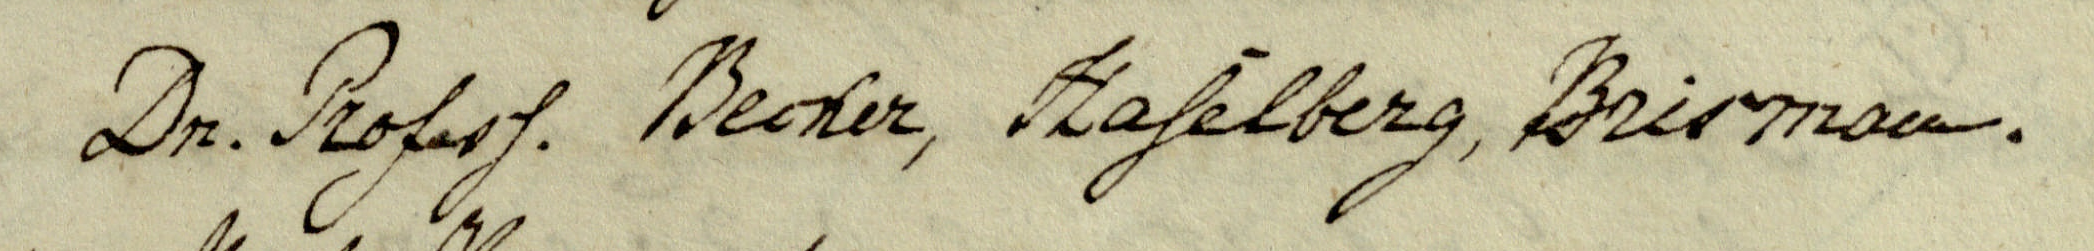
Dn. Profess. Becker, Haselberg, Brisman.
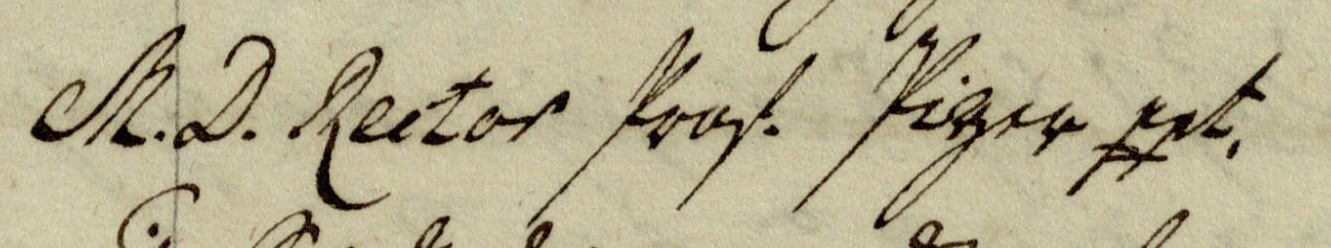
M. D. Rector Prof. Piper ppt.
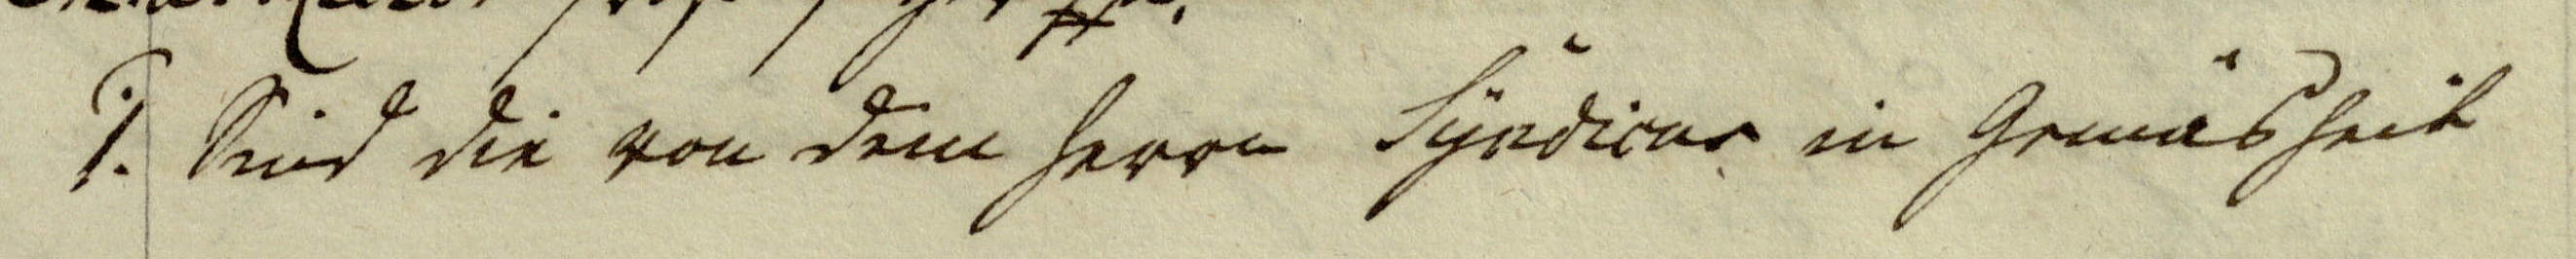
1. Sind die von dem Herrn Sÿndicus in Gemäsheit
